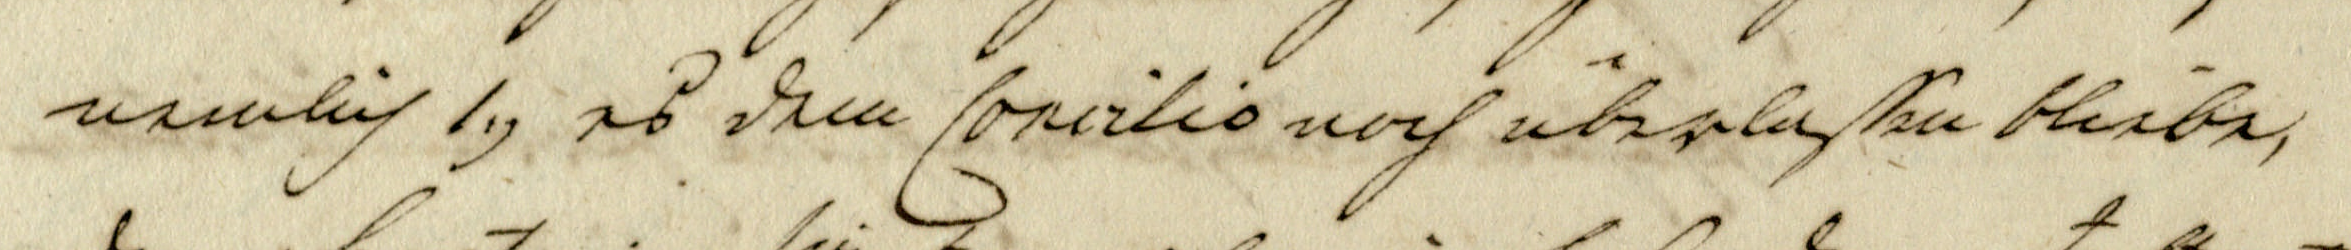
nemlich 1., es dem Concilio noch überlassen bliebe,
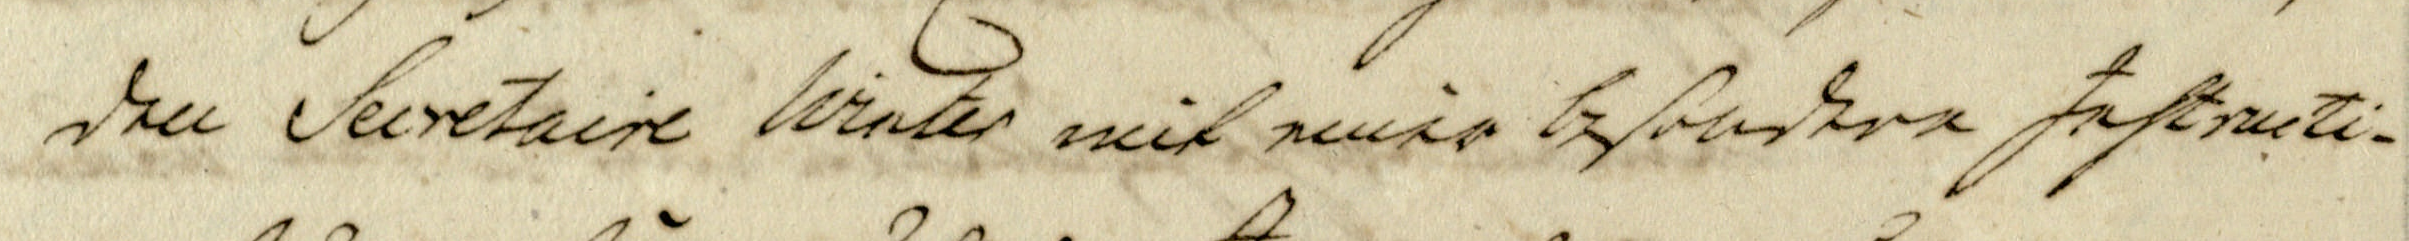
den Secretaire Winter mit einer besondern Instructi¬
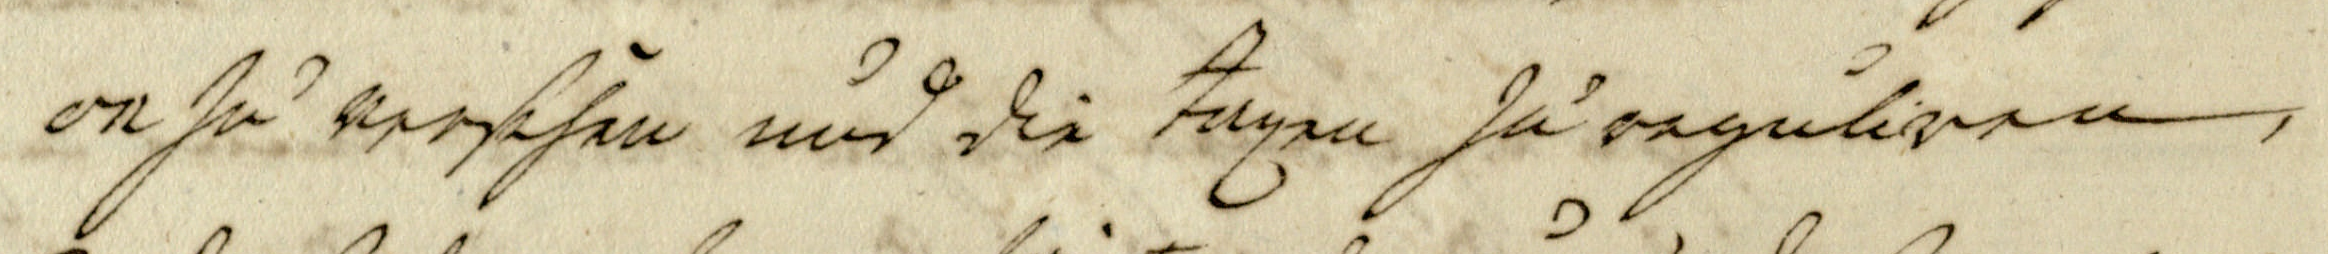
on zu versehen und die Taxen zureguliren,
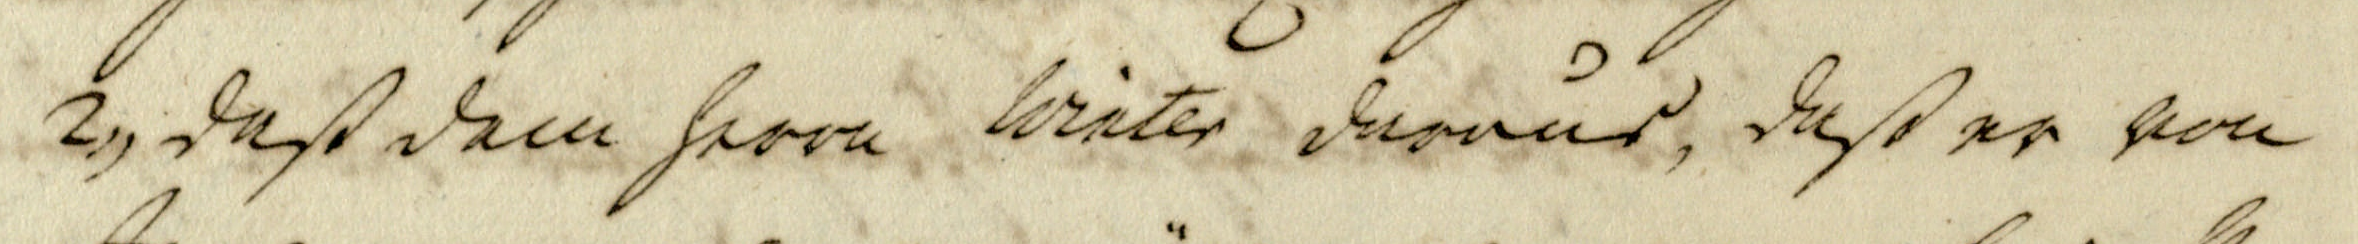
2., daß dem herrn Winter daraus, daß er von
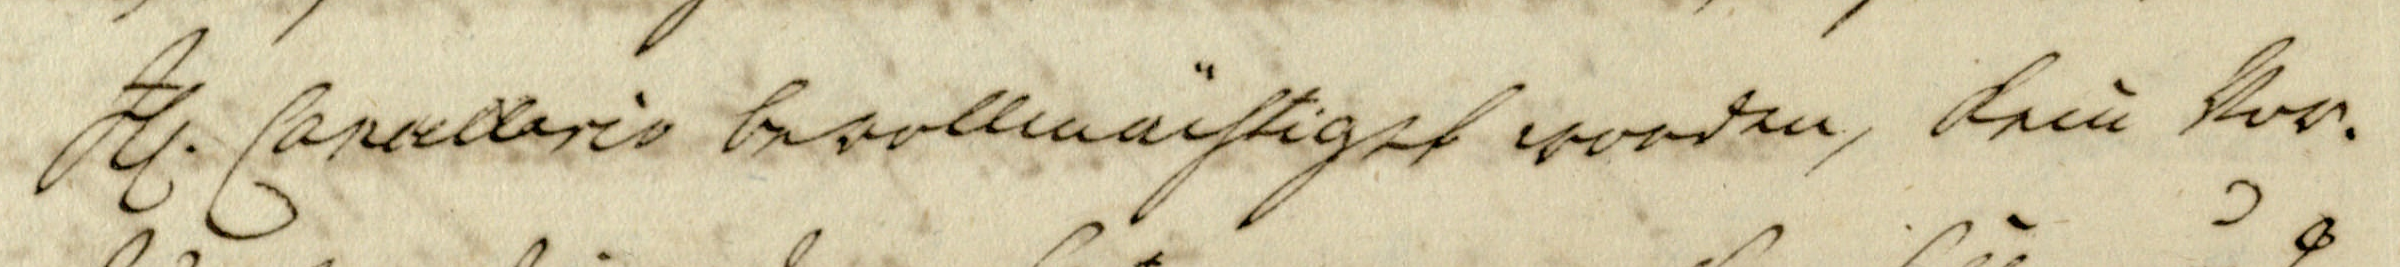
Ill. Cancellario bevollmächtiget worden, kein Vor¬
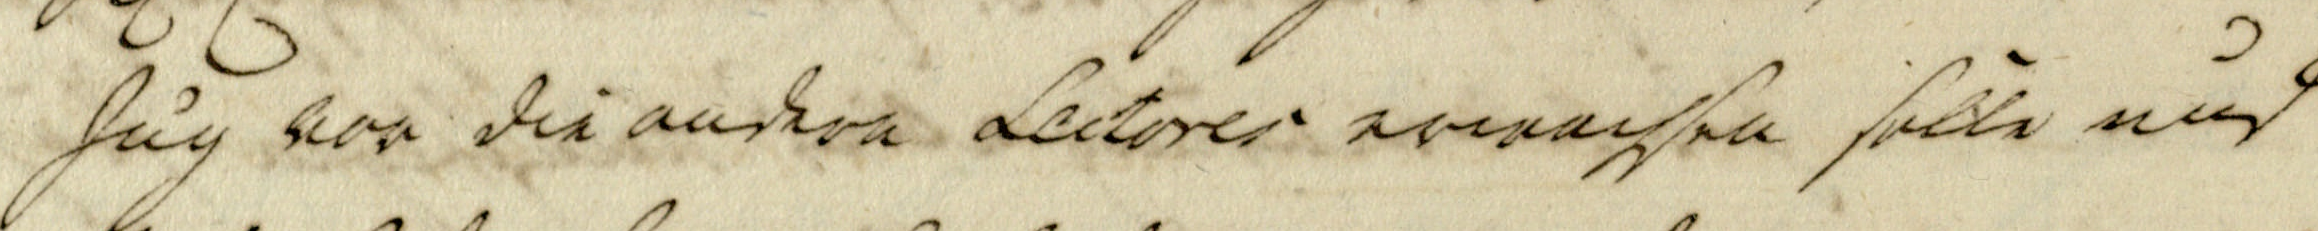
zug vor die andern Lectores erwachsen solle und
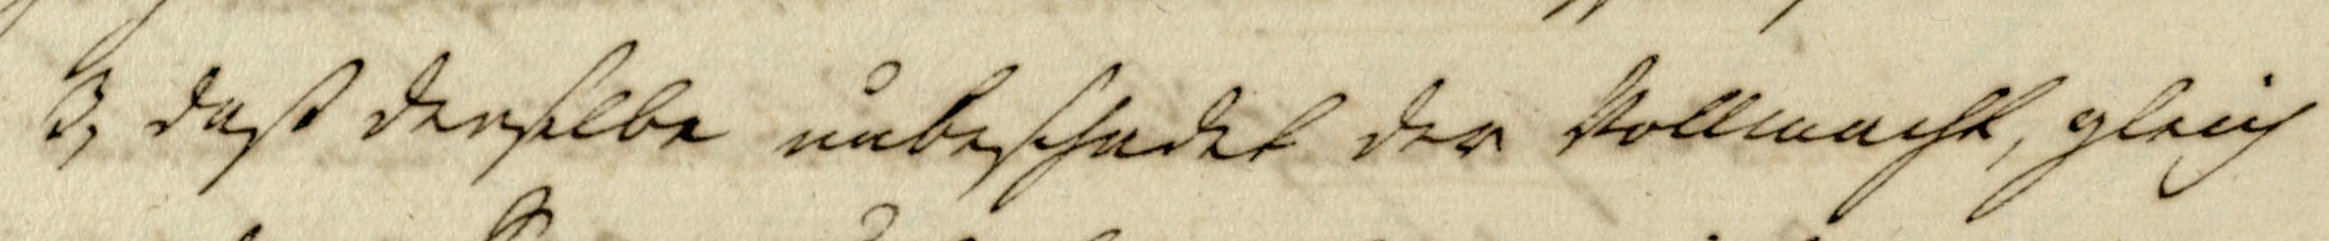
3., daß derselbe unbeschadet der Vollmacht, gleich
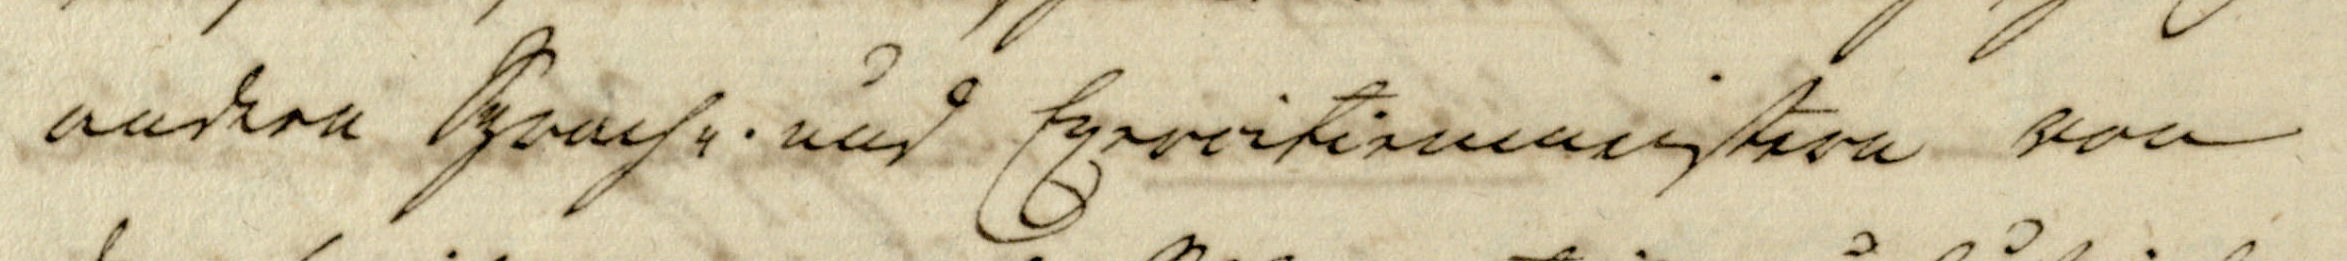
andern Sprach- und Exercitienmeistern von
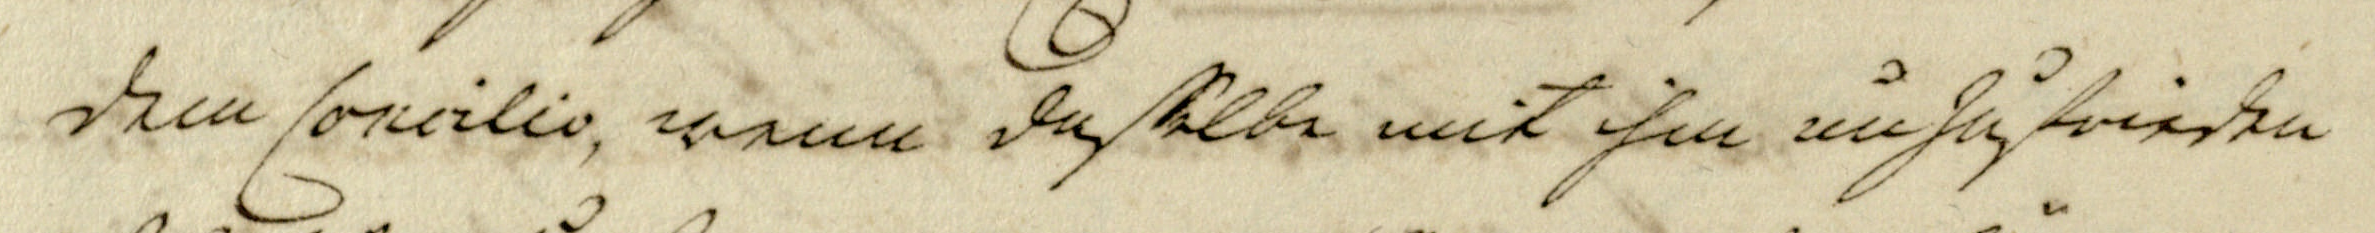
dem Concilio, wenn dasselbe mit ihm unzufrieden
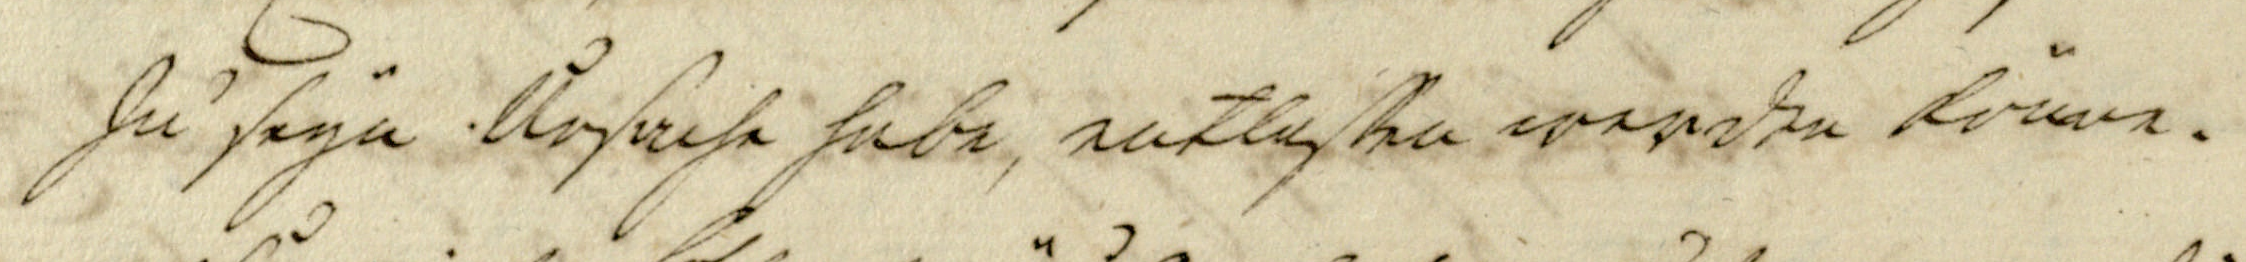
zu seÿn Ursache habe, entlassen werden könne.
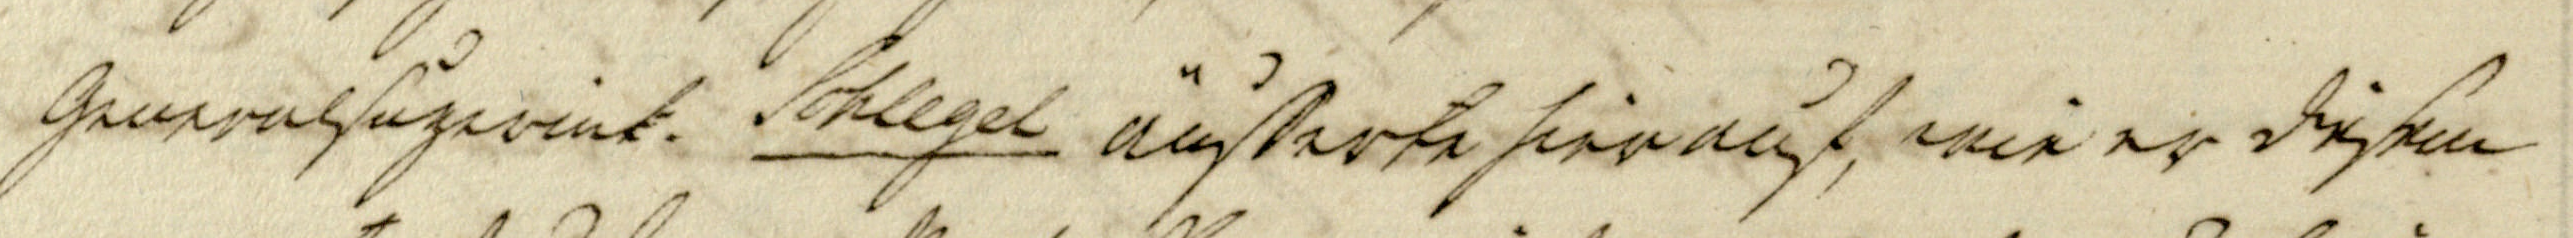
Generalsuperint. Schlegel äusserte hierauf, wie er diesem
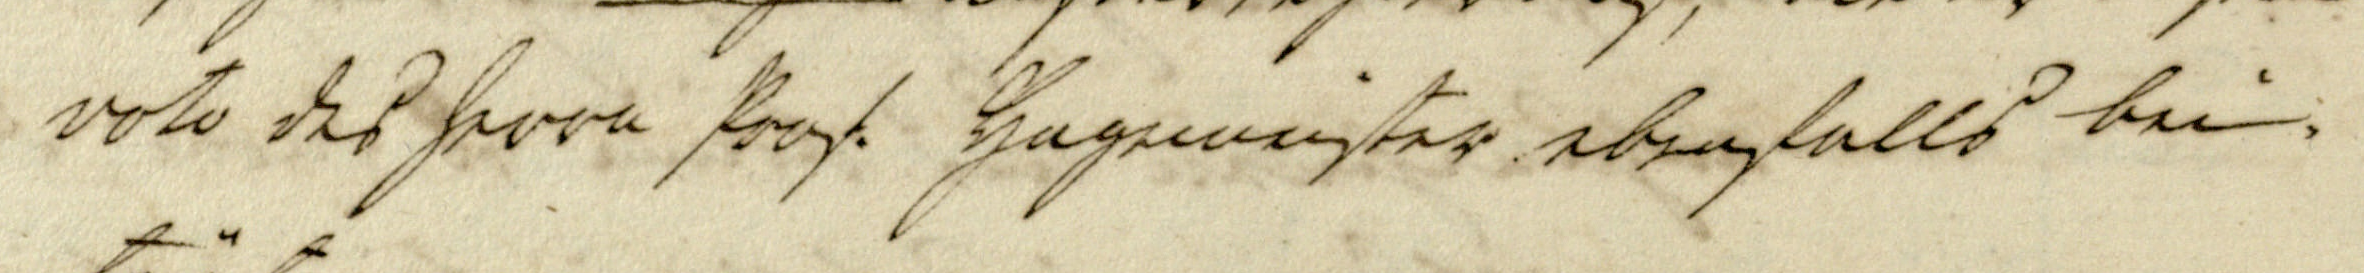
voto des Herrn Prof. Hagemeister ebenfalls bei¬
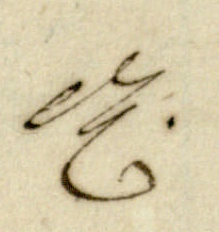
dh.
